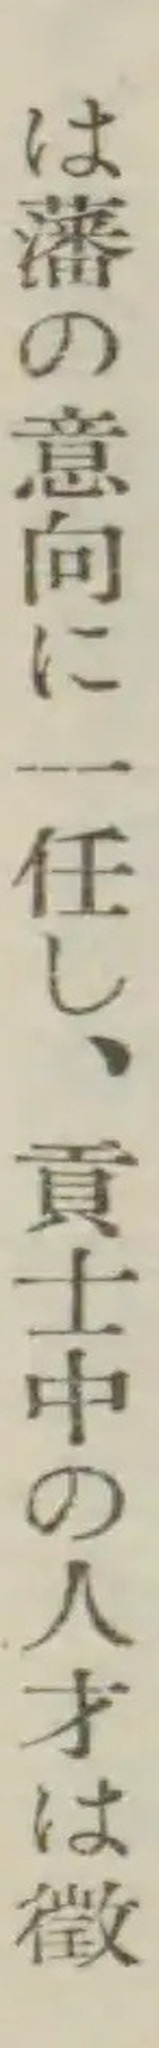は藩の意向に一任し、貢士中の人才は徴
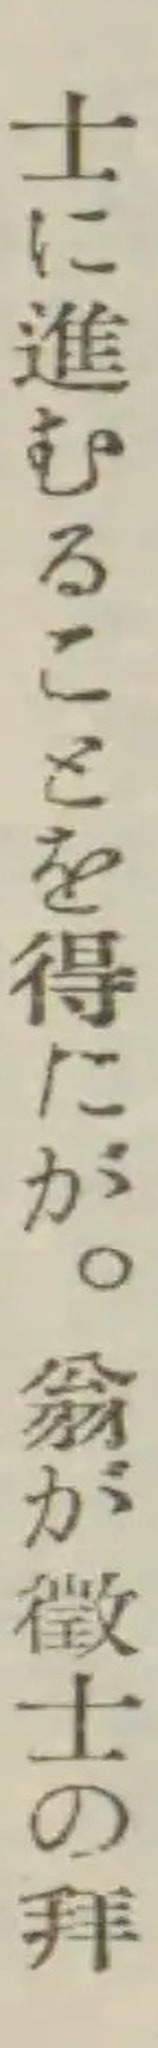士に進むることを得たが。翁が徴士の拝
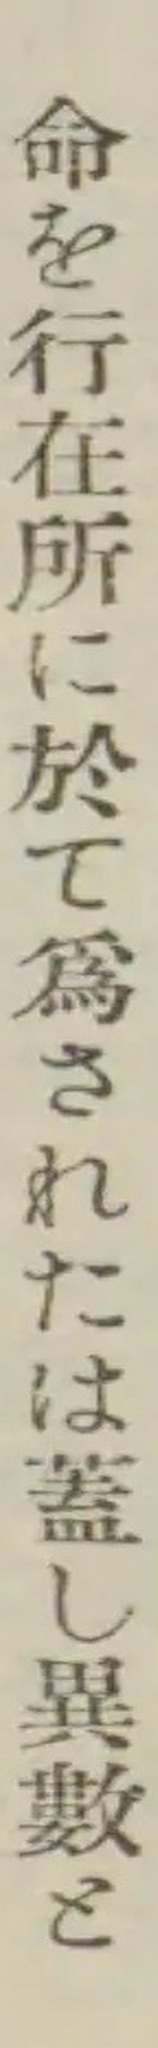命を行在所に於て為されたは蓋し異数と
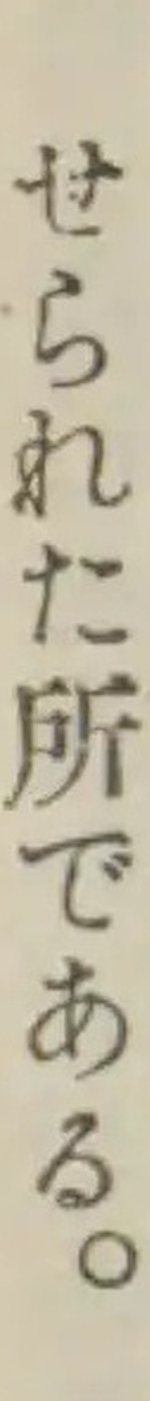せられた所である。

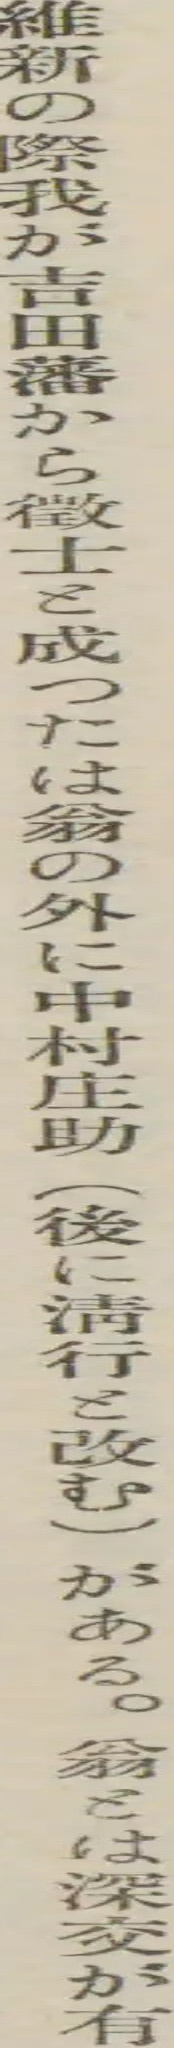維新の際我が吉田藩から徴士と成つたは翁の外に中村庄助(後に清行と改む)がある。翁とは深交が有
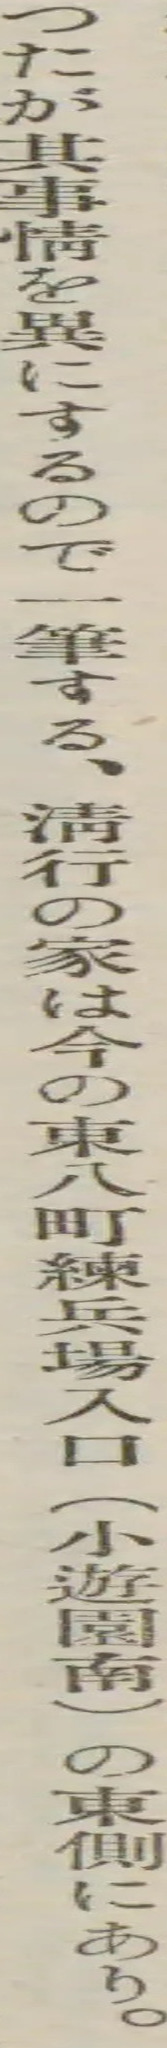つたが其事情を異にするので一筆する、清行の家は今の東八町練兵場入口(小遊園南)の東側にあり。
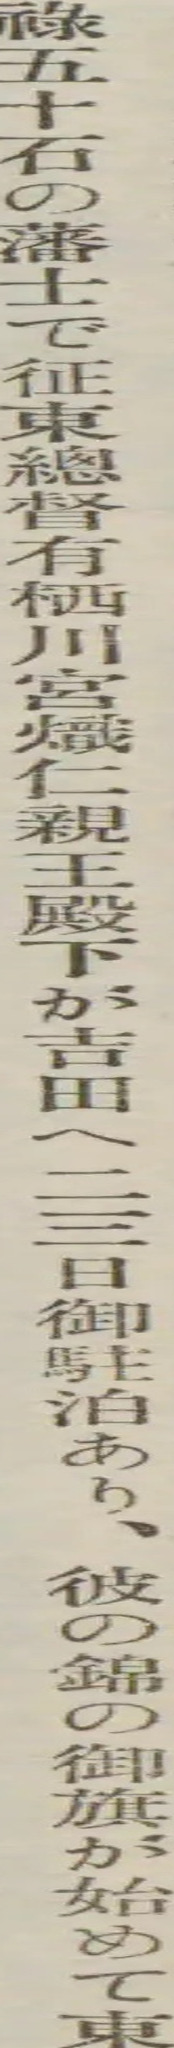禄五十石の藩士で征東総督有栖川宮熾仁親王殿下が吉田へ二三日御駐泊あり、彼の錦の御旗が始めて東
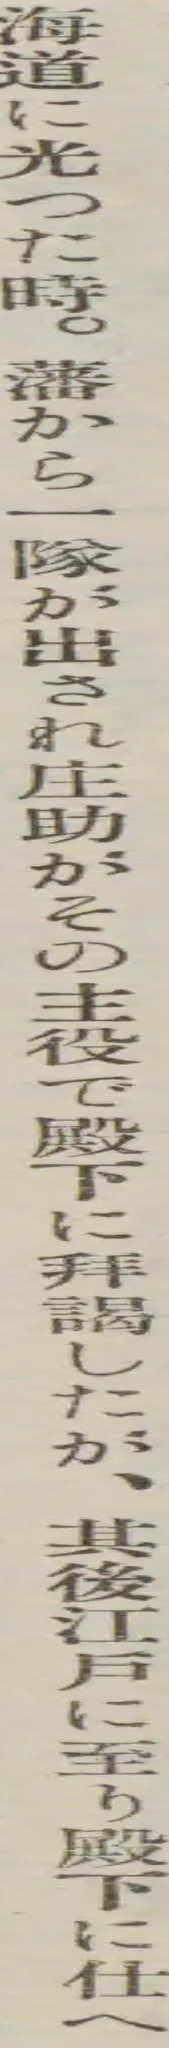海道に光つた時。藩から一隊が出され庄助がその主役で殿下に拝謁したが、其後江戸に至り殿下に仕へ
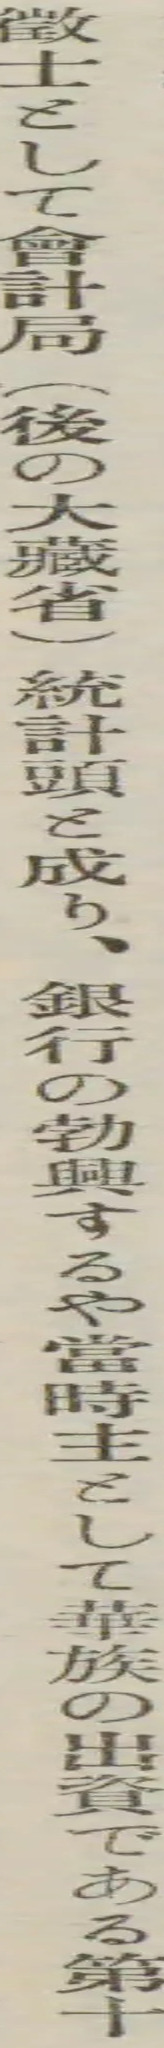徴士として会計局(後の大蔵省)統計頭と成り、銀行の勃興するや当時主として華族の出資である第十
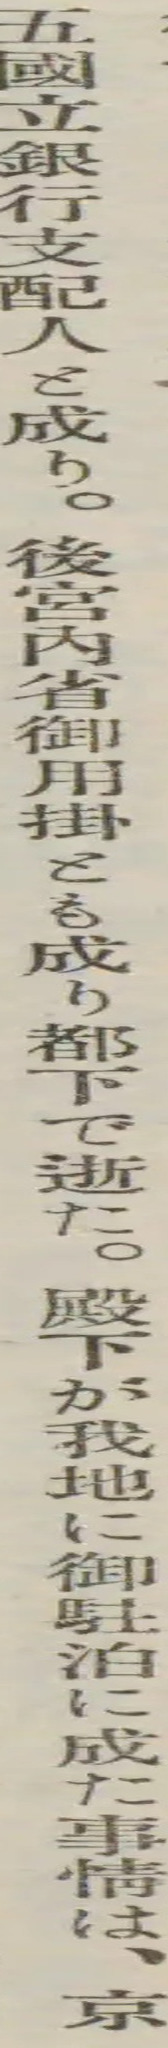五国立銀行支配人と成り。後宮内省御用掛とも成り都下で逝た。殿下が我地に御駐泊に成た事情は、京
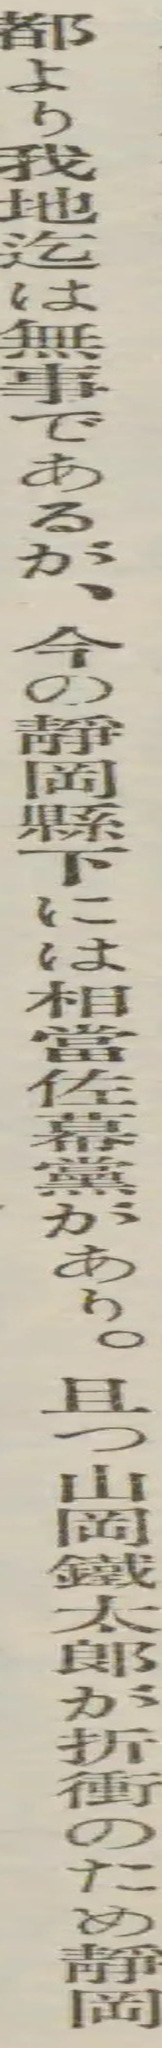都より我地迄は無事であるが、今の静岡県下には相当佐幕党があり。且つ山岡鐵太郎が折衝のため静岡
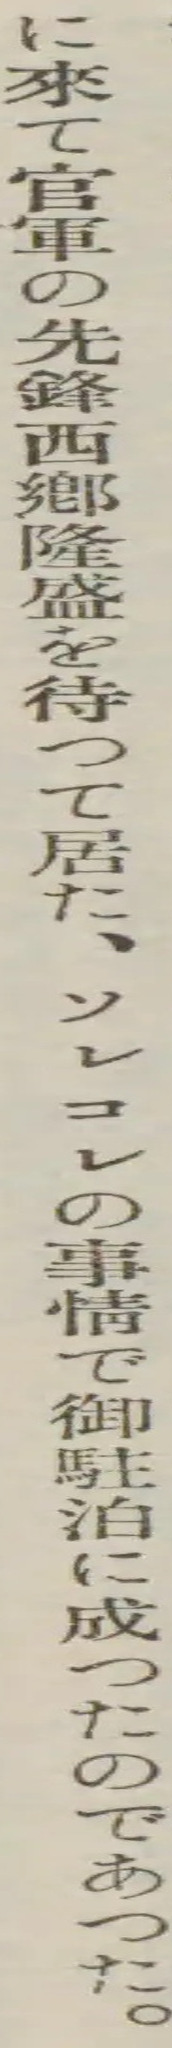に来て官軍の先鋒西郷隆盛を待つて居た、ソレコレの事情で御駐泊に成つたのであつた。
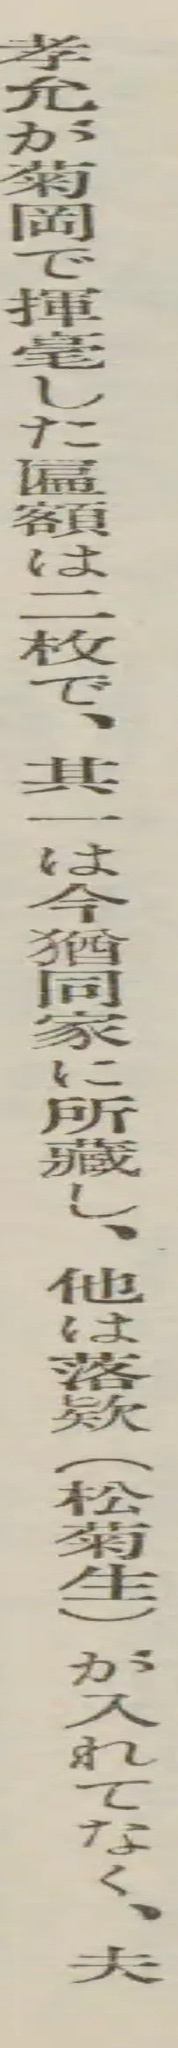孝允が菊岡で揮毫した扁額は二枚で、其一は今猶同家に所蔵し、他は落款(松菊生)が入れてなく、夫
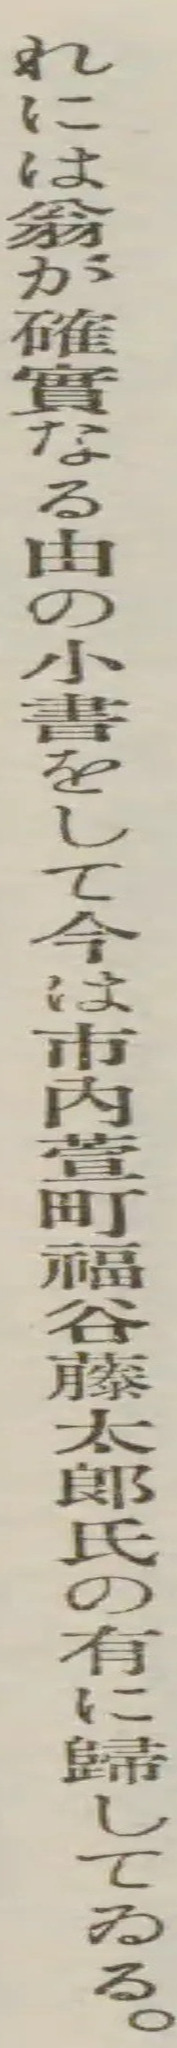れには翁が確実なる由の小書をして今はしない萱町福谷藤太郎氏の有に帰してゐる。
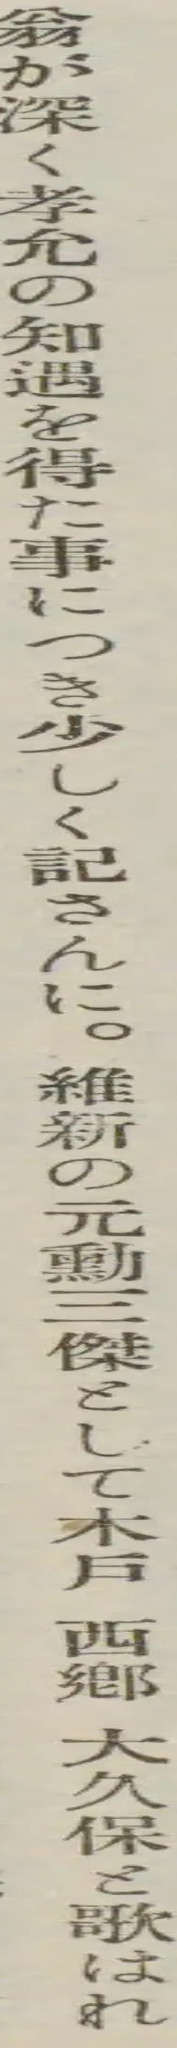翁が深く孝允の知遇を得た事につき少しく記さんに。維新の元勲三傑として木戸西郷大久保と歌はれ
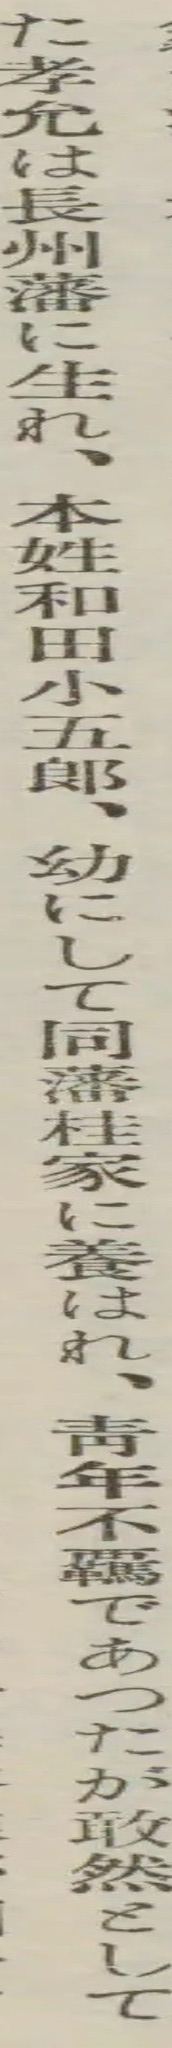た孝允は長州藩に生れ、本姓和田小五郎、幼にして同藩桂家に養はれ、青年不覊であつたが敢然として
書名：小野湖山翁小伝
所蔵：国立国会図書館 National Diet Library, JAPAN
